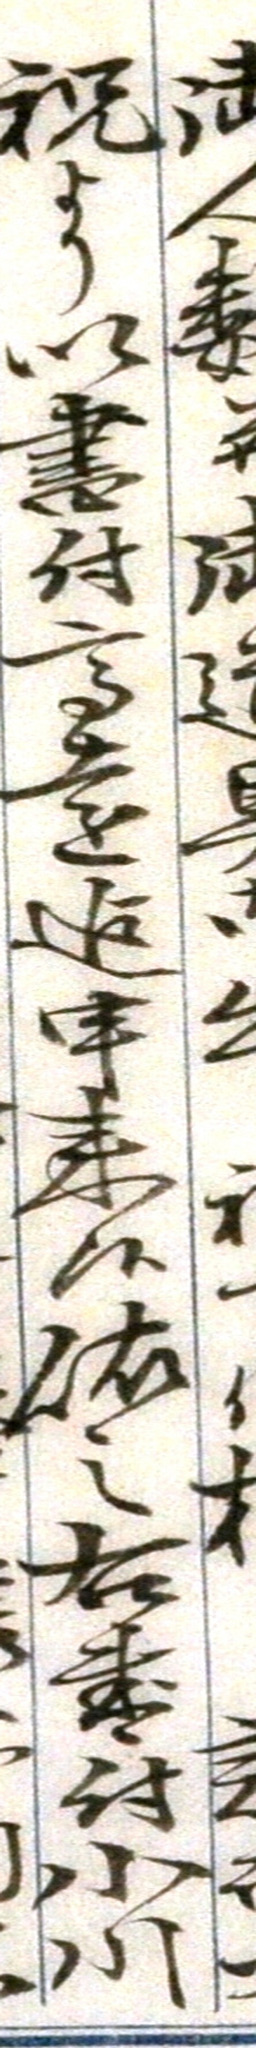祝より以書付高遠迄申来候依之右書付小川
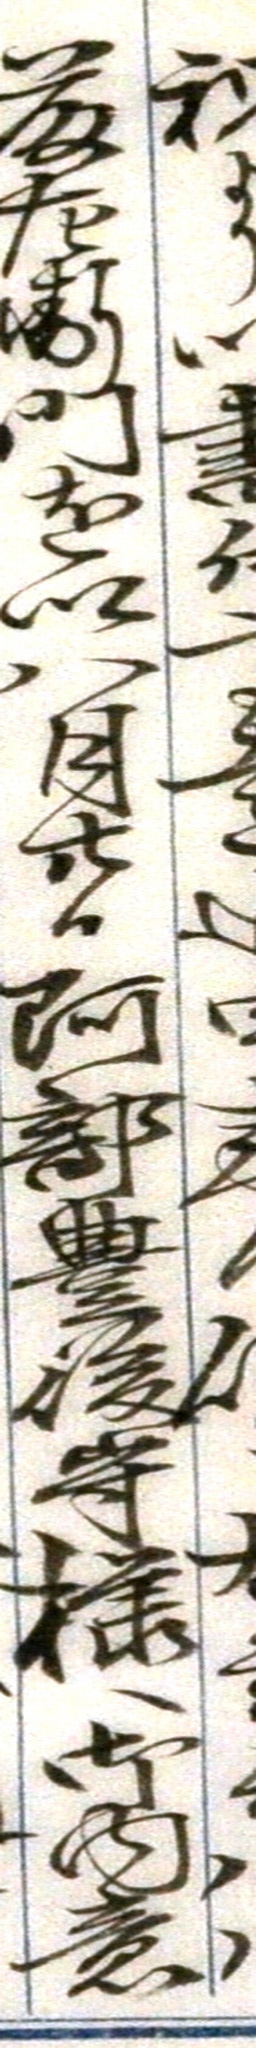藤左衛門を以八月廿日阿部豊後守様へ御内意
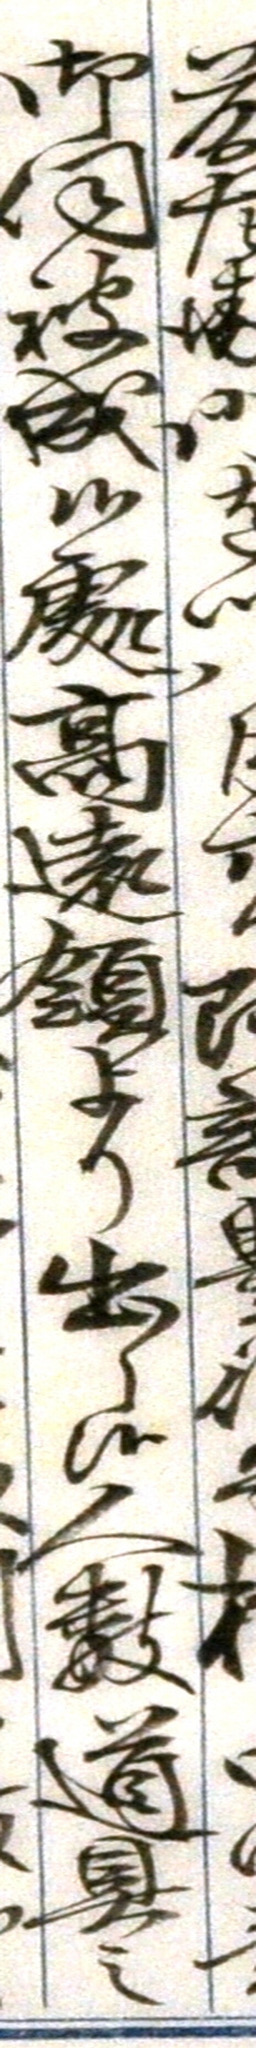御伺被成候処高遠領より出し候人数道具之
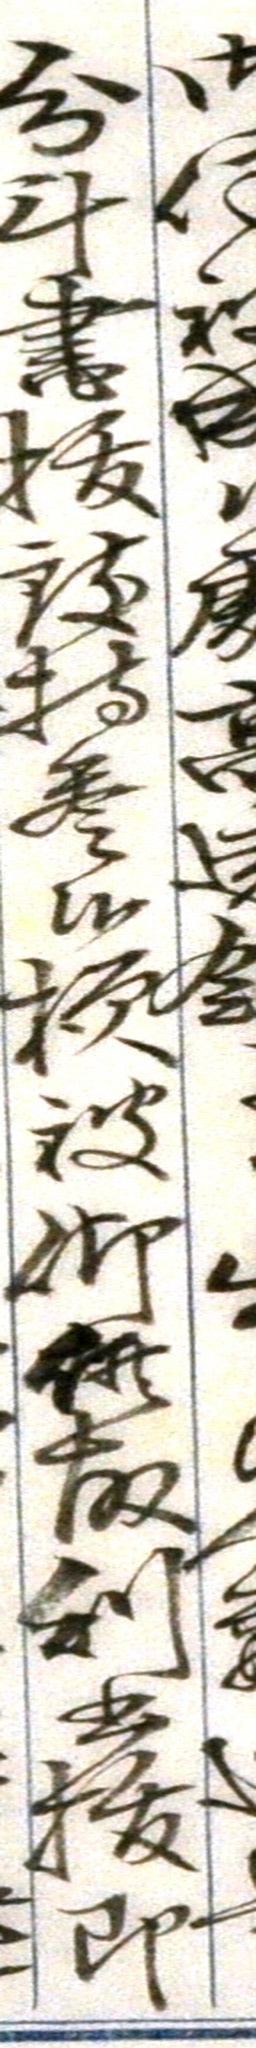分計書抜致持参候様被仰候故則書抜即
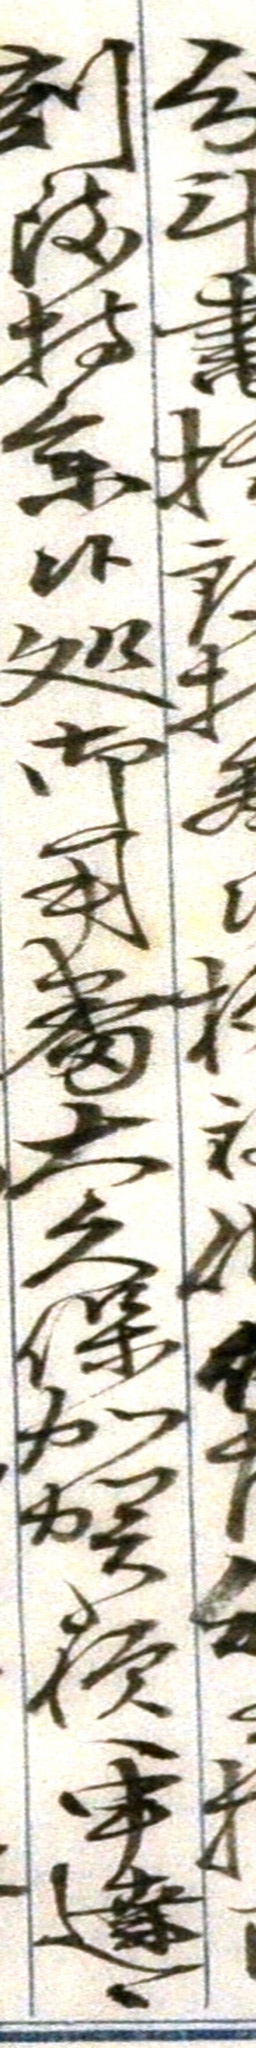刻被持参候処御用番大久保加賀様へ申達候
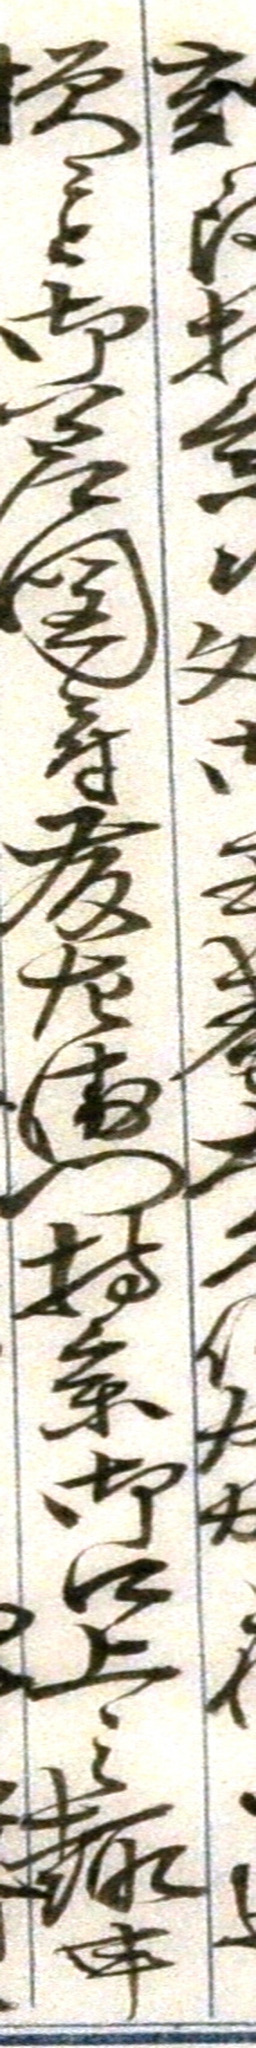様ニと御差図ニ付藤左衛門持参御口上之趣申
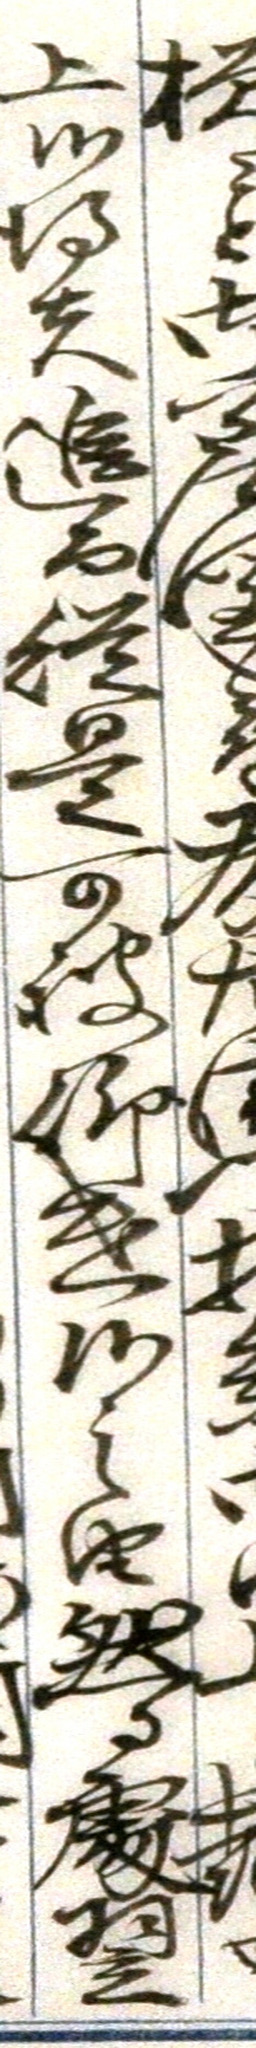上候得者追而従是可被仰遣候之由然る処翌
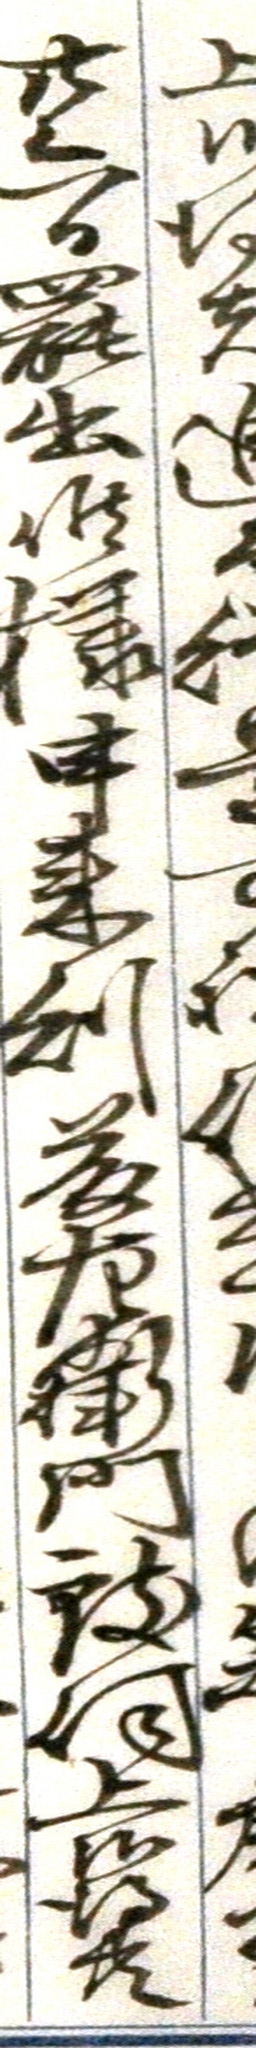廿六日罷出候様申来則藤左衛門致伺上候得共
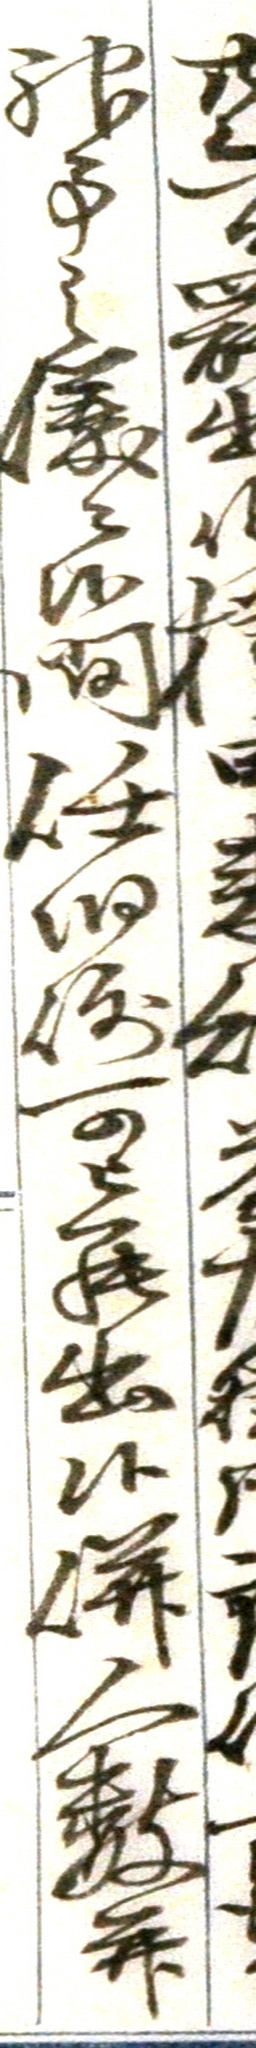神事之儀ニ候間任旧例可被罷出候併人数并

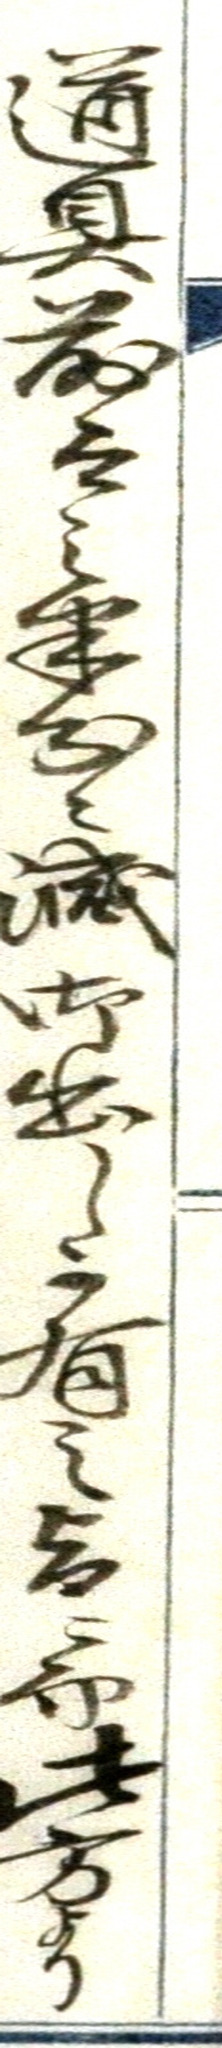道具前々之半分ニ減御出し可有之旨ニ而此方より
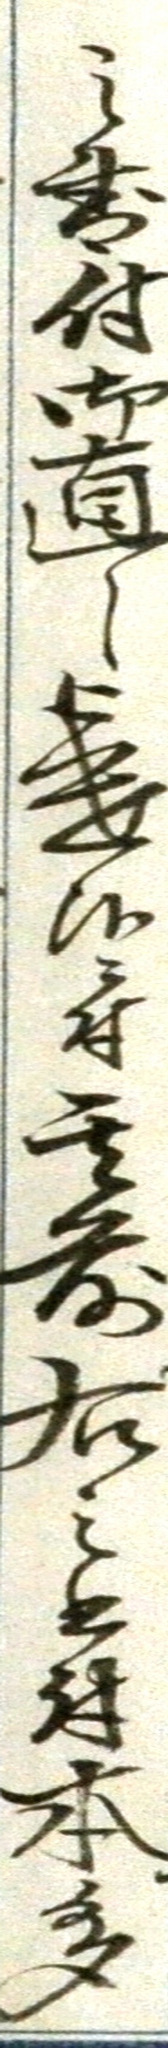之書付御直し被遣候ニ付其前右之書付本多
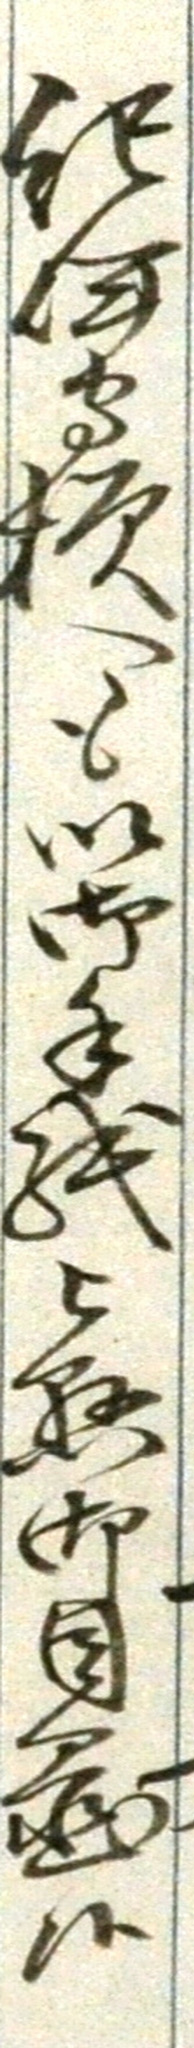紀伊守様へも以御手紙被懸御目置候
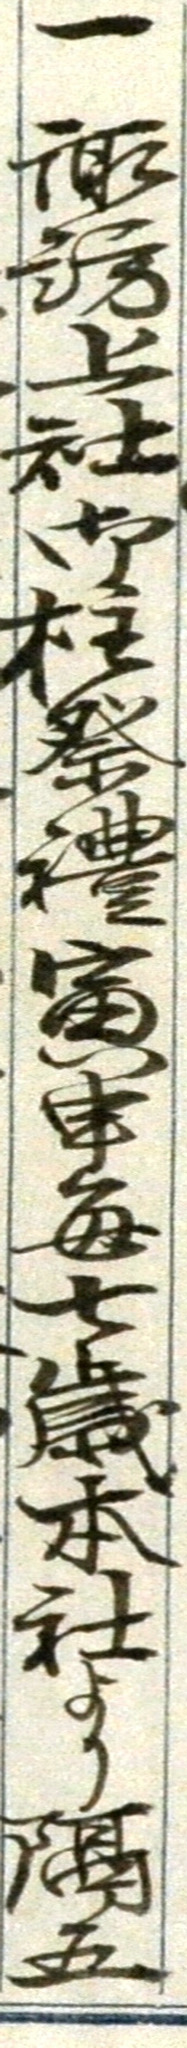一諏訪上社御柱祭礼寅申毎七歳本社より隔五
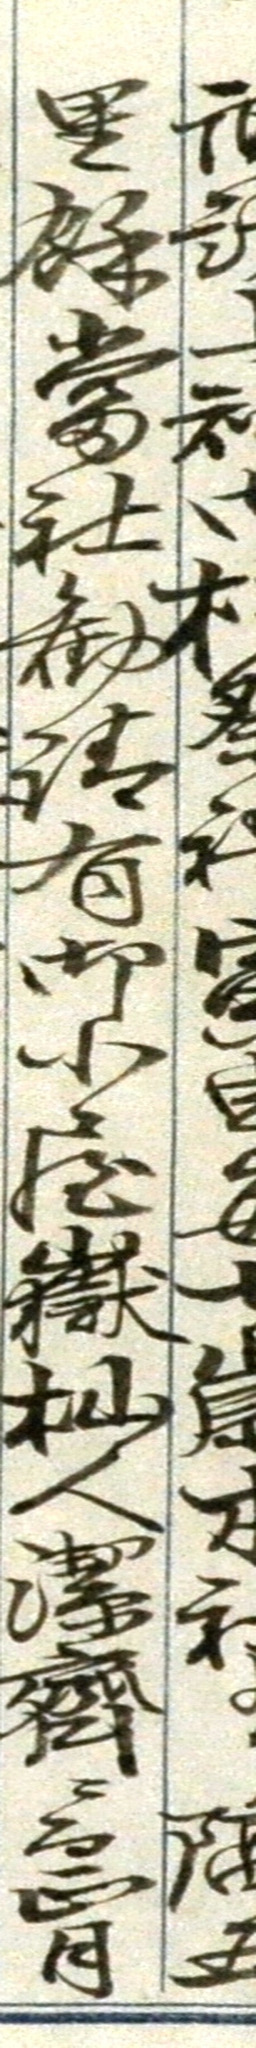里余当社勧請有御小屋嶽杣人潔斎ニ而正月
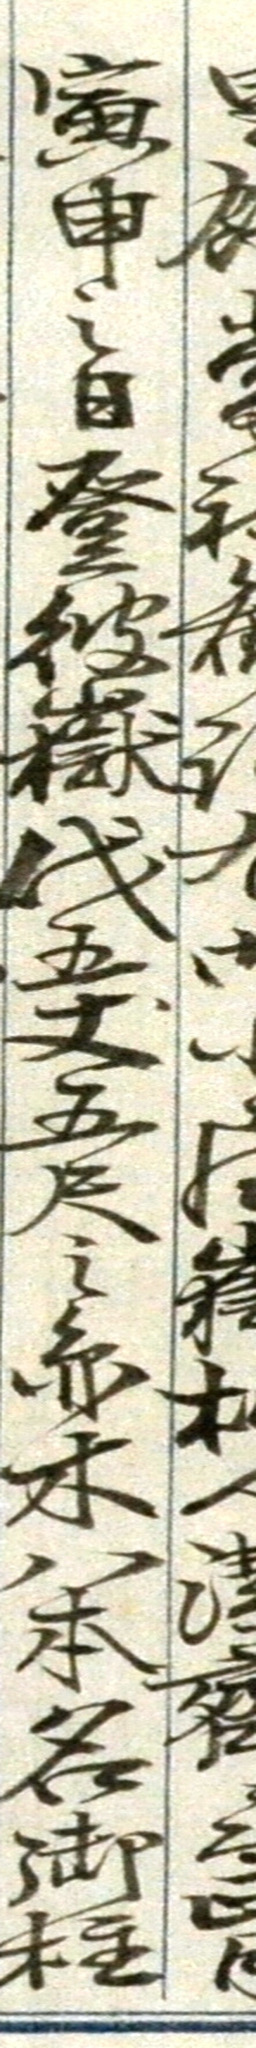寅申之日登彼嶽伐五丈五尺之円木八本名御柱
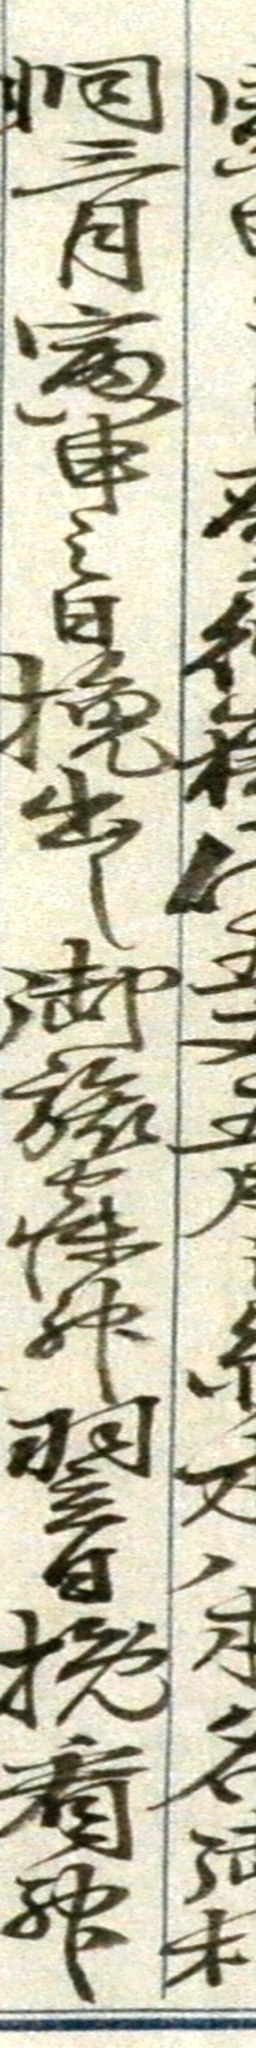同三月寅申之日挽出し御旅寢神翌日挽看神
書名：諏訪御柱祭之節・騎馬大将御中間頭・御柱引人足
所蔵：伊那市立高遠町図書館・合同会社AMANE
